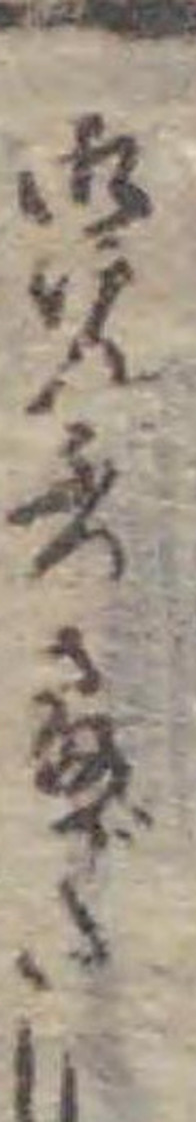御けんふつさまがた
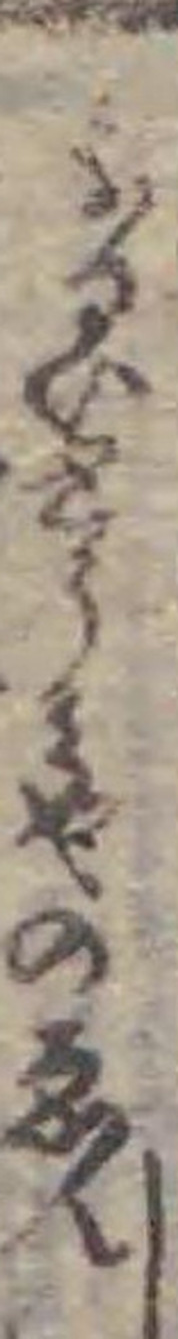ふるいとうみやのゑん
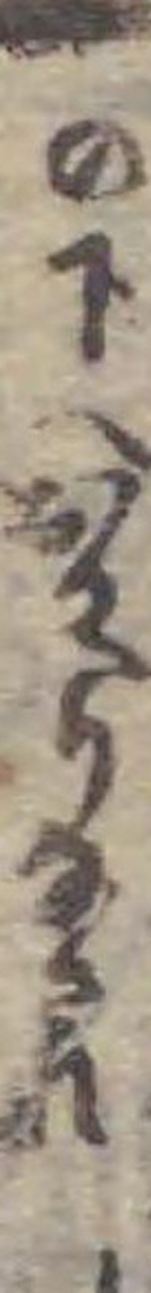の下へおかへりなされ
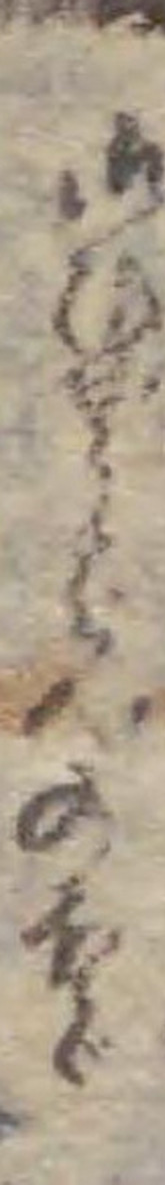御ひやうはんのほど
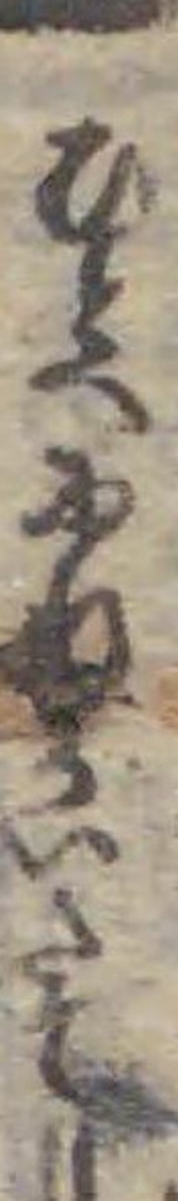ひとへにねかいたて
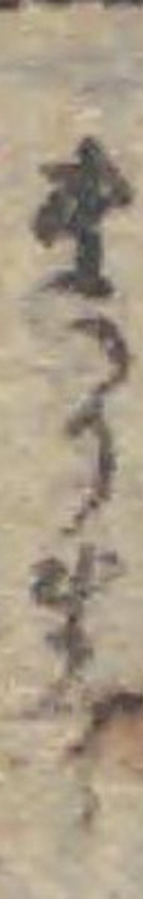まつります

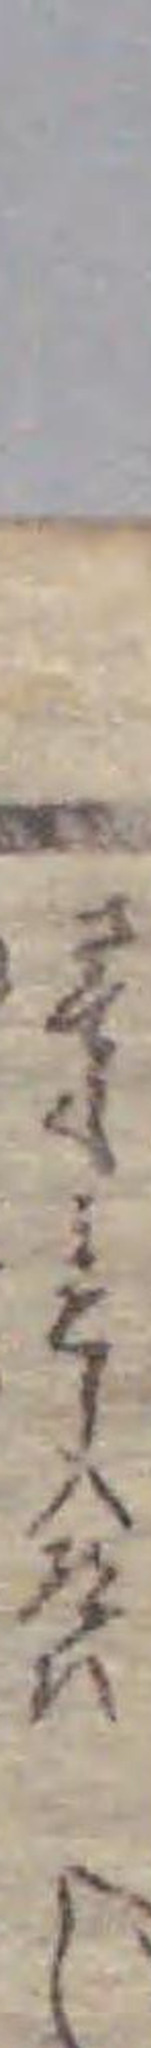さてもみこし入道は
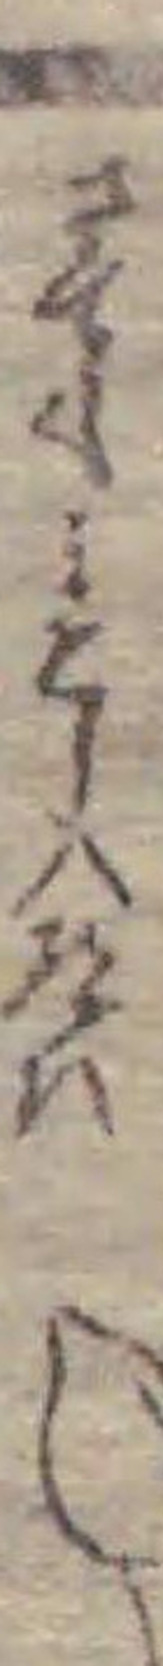さてもみこし入道は
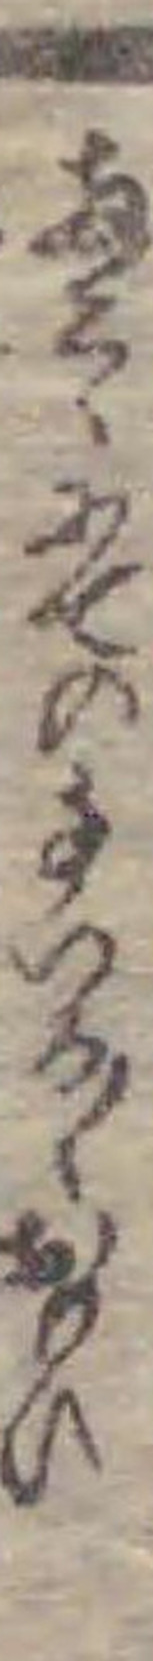両こくにての事いろ〳〵思い
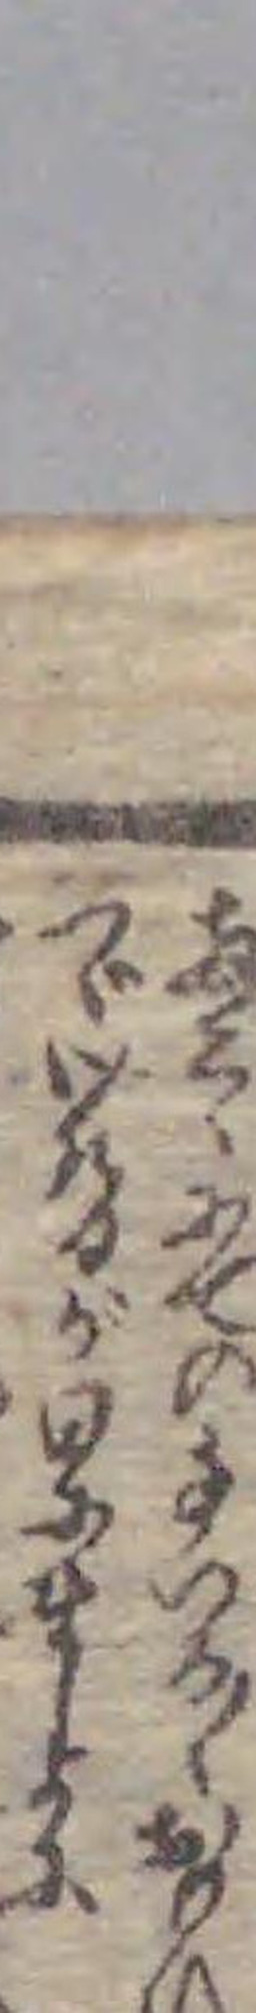つゞけけるが日にましよに
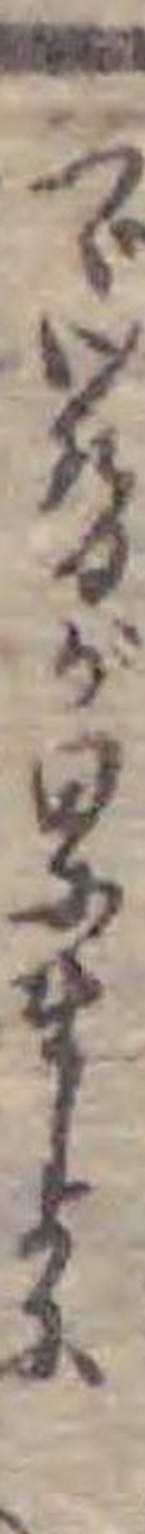つゞけけるが日にましよに
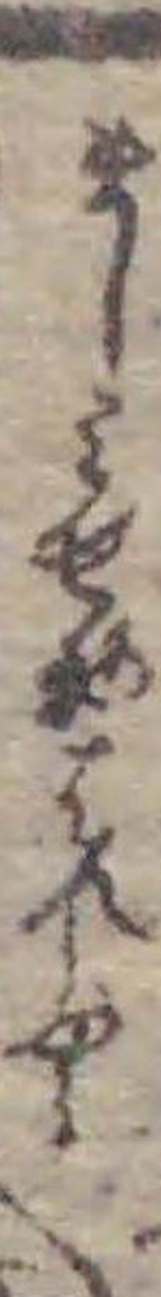ましみせ物はんしやう
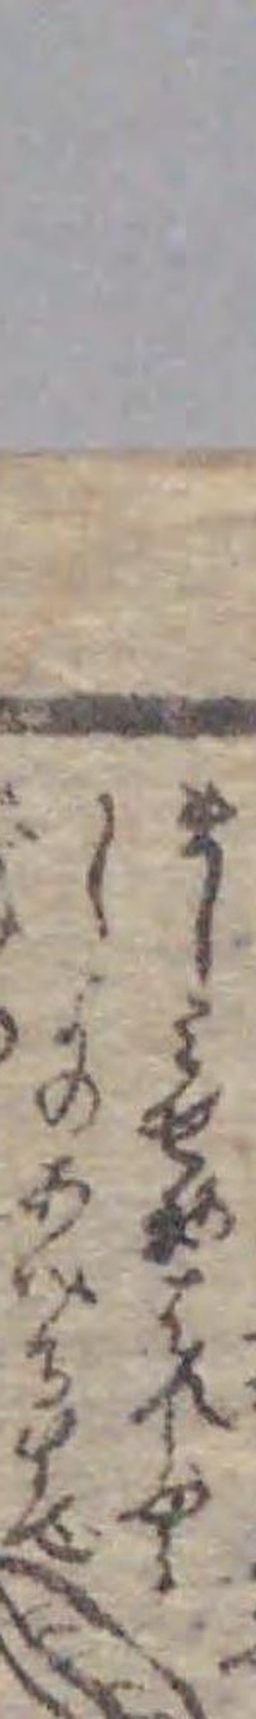しよのあけるまで
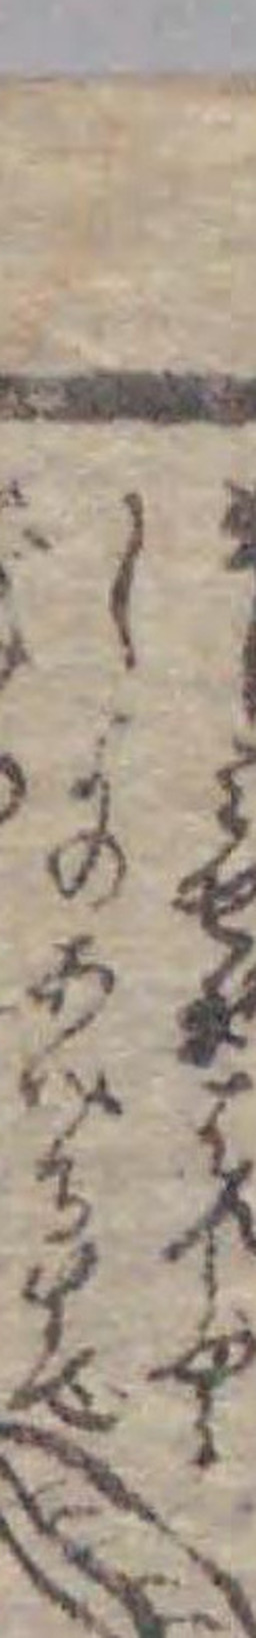しよのあけるまで
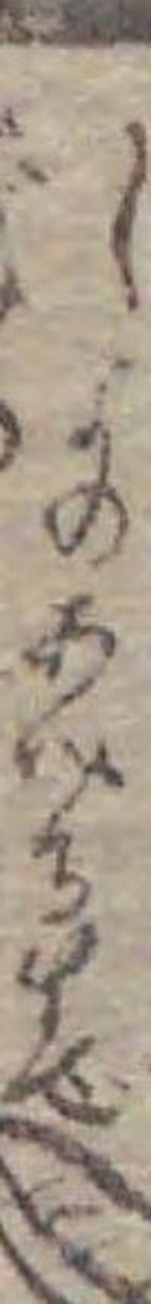しよのあけるまで
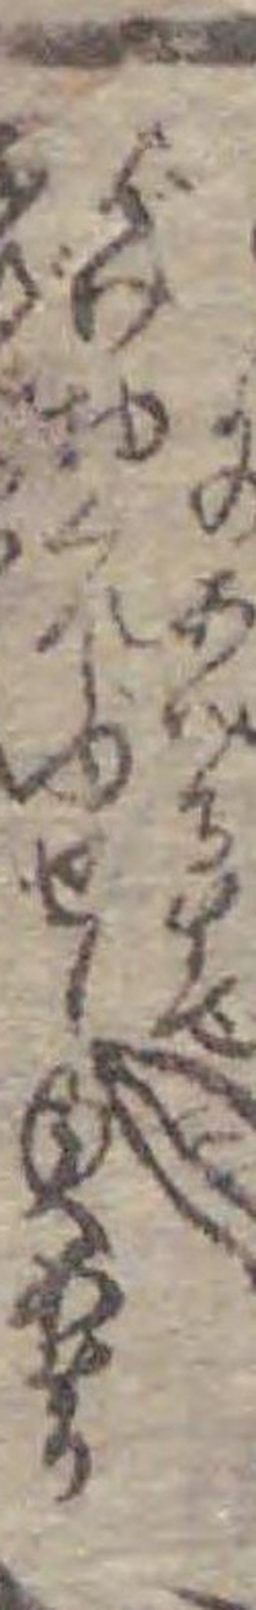ばけ物くんじゆせしゆへあまり
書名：[化物一代記] : 5巻
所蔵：国立国会図書館 National Diet Library, JAPAN
